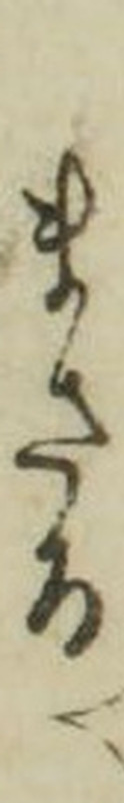まさる
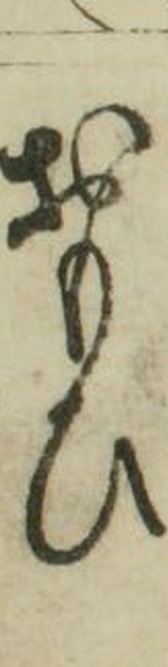おもひ
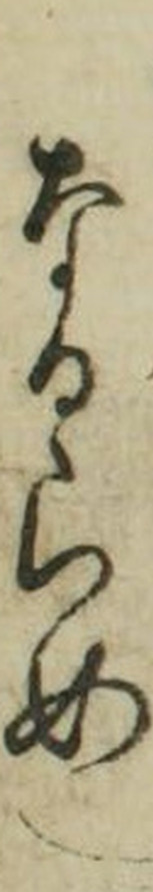なるらめ

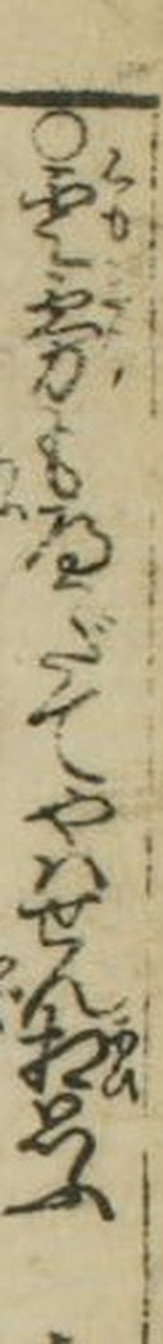○雲霧もへだてやはせん相思ふ季信
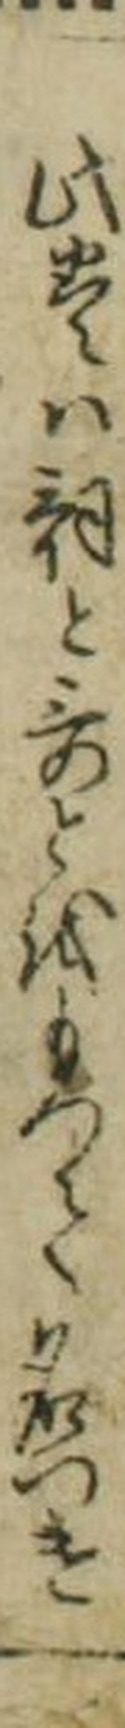此巻は詞と哥とをもつて名つけ
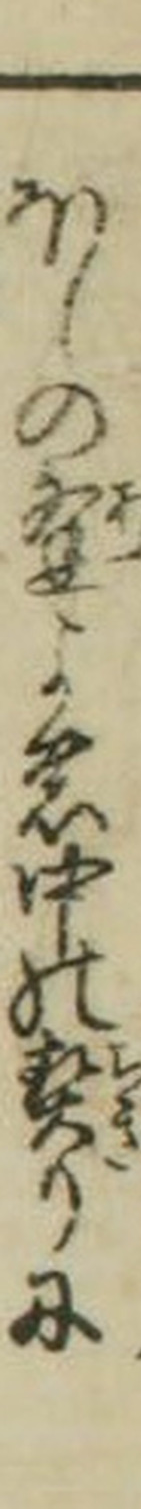ほしの逢よの中の契りに
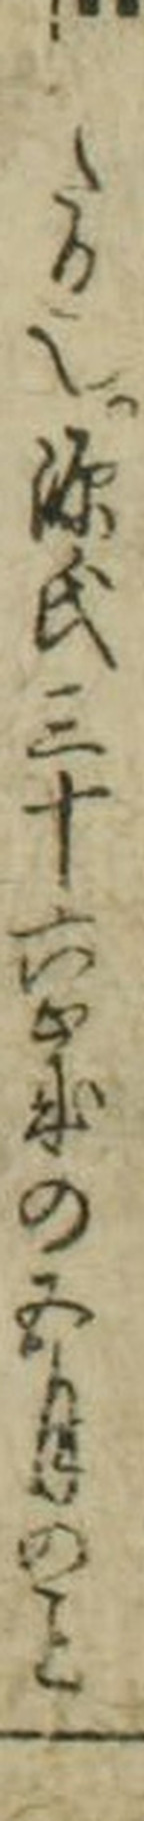たる也。源氏三十六歳の五月のこと
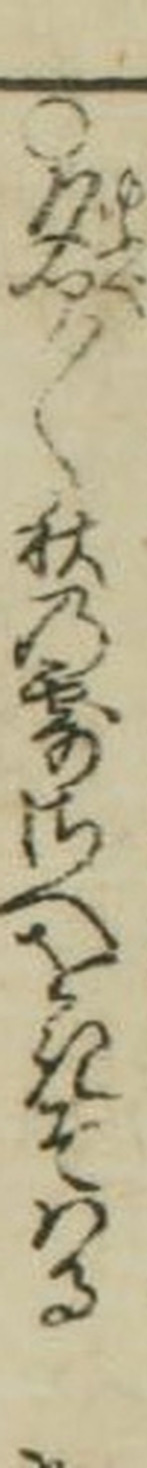○夕部〳〵秋の露さへをきそはる雅庸
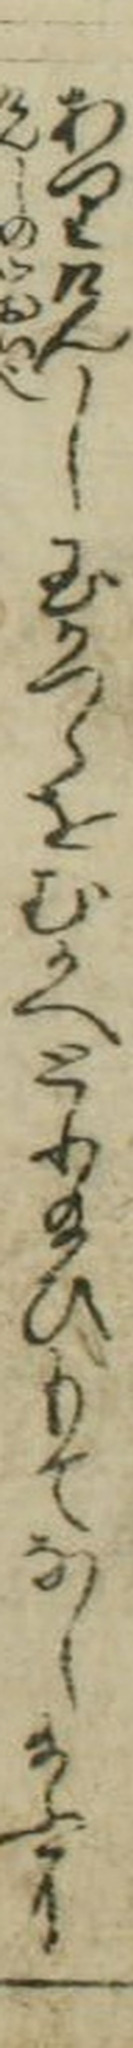あり源氏玉かつらをむかへとり給ひもてなし給ふに
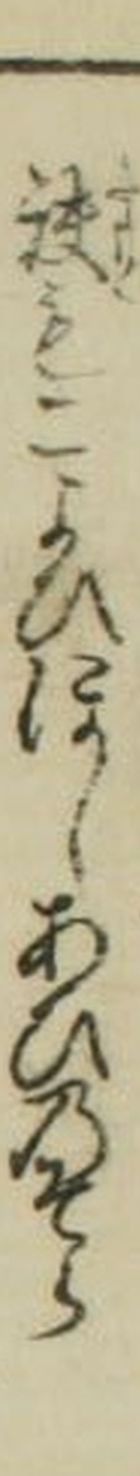袂もこよひほしあひのそら
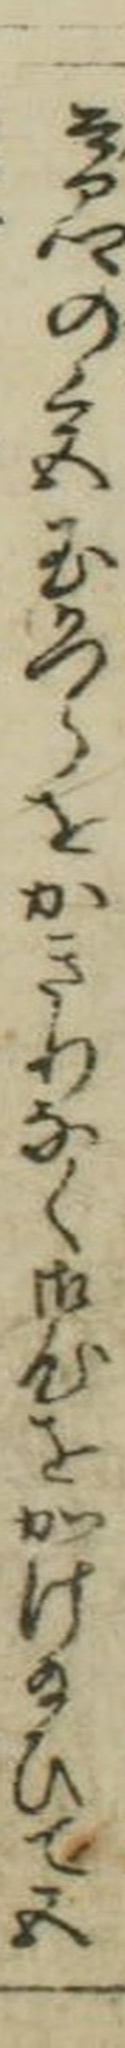兵部卿の宮玉かつらをかきりなく御心をかけ給ひて五
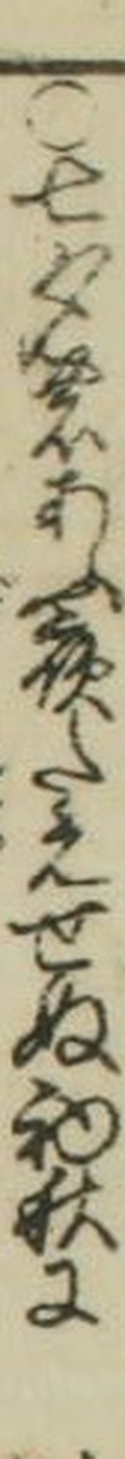○七夕のあふ夜たえせぬ初秋に時量
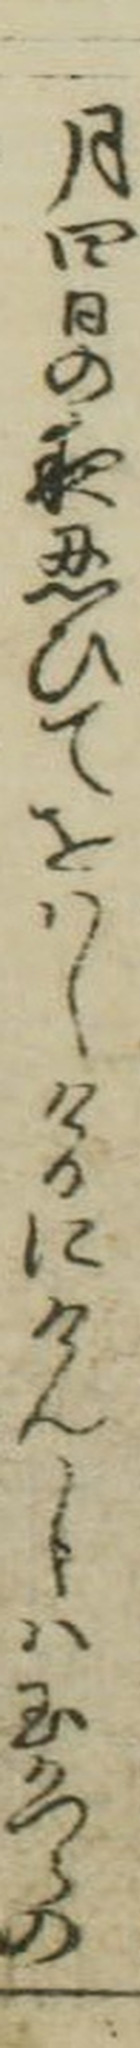月四日の夜忍ひてをはしけるにけんしは玉かつらの
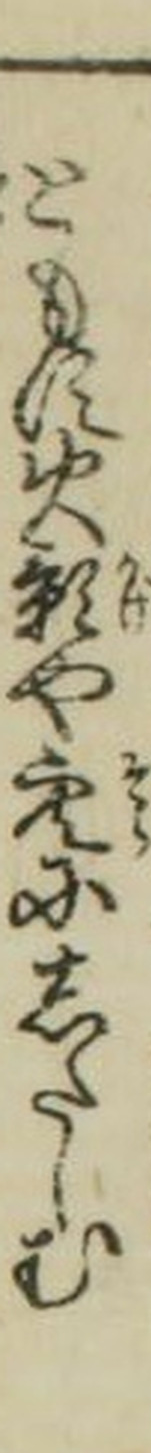ともす火影や空にしたしむ
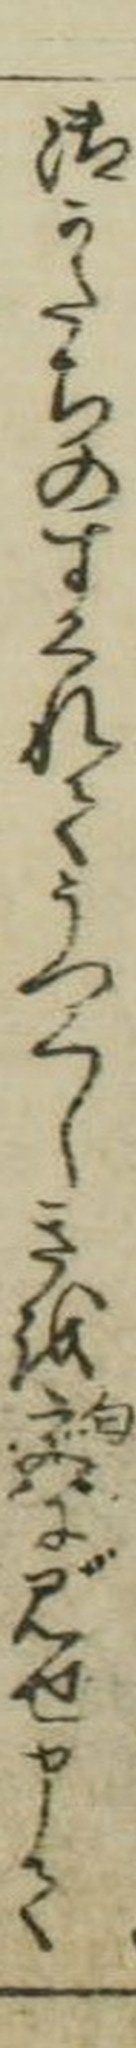御かたちのすくれてうつくしきを宮に見せ申て
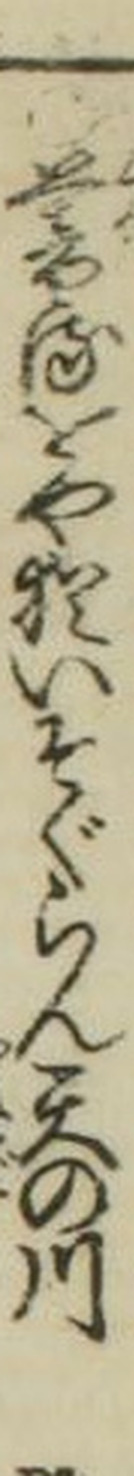○暮るをや猶いそぐらん天の川雅房
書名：女源氏教訓鑑
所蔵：東京学芸大学附属図書館
